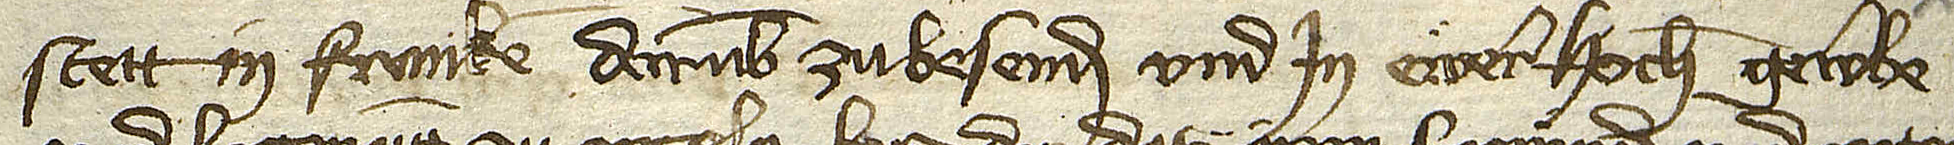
ſtett in franke* darub* ʒu beſend* vnd In ewer* Hoch* gew*be
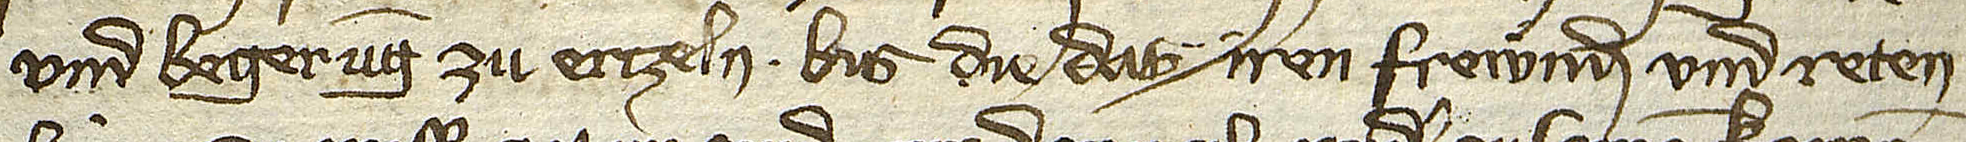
vnd beger*ug ʒu ercʒeln . bis die das iren frewnd* vnd reten
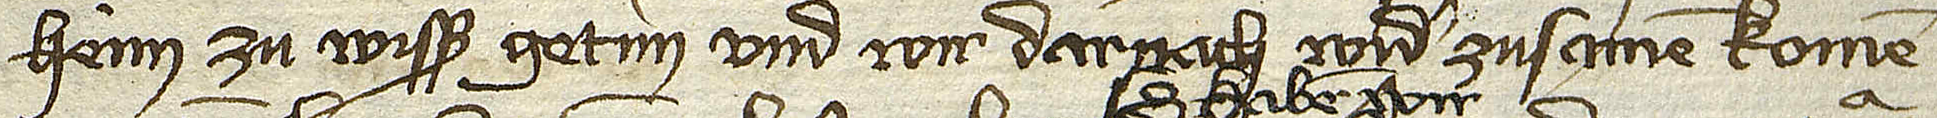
heim ʒu wiſſ* getun vnd wir darnach wid* ʒuſame* kome*
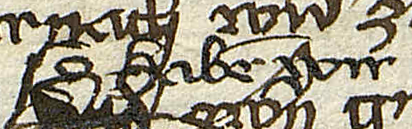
ſo habe* wir
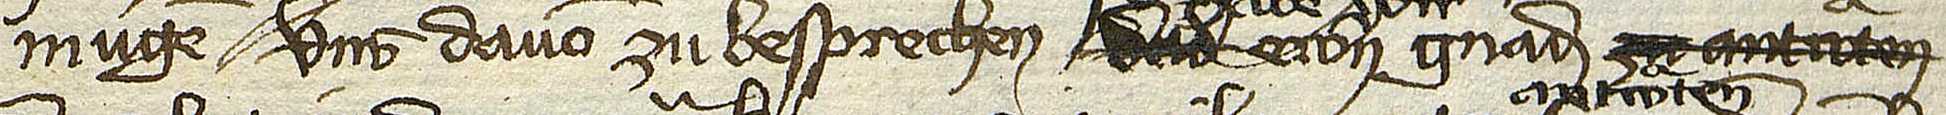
muge* / Vns dauo* ʒu beſprechen / Vnd ewn* gnad* ʒu antw*ten
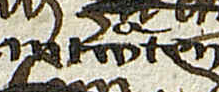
antw*ten
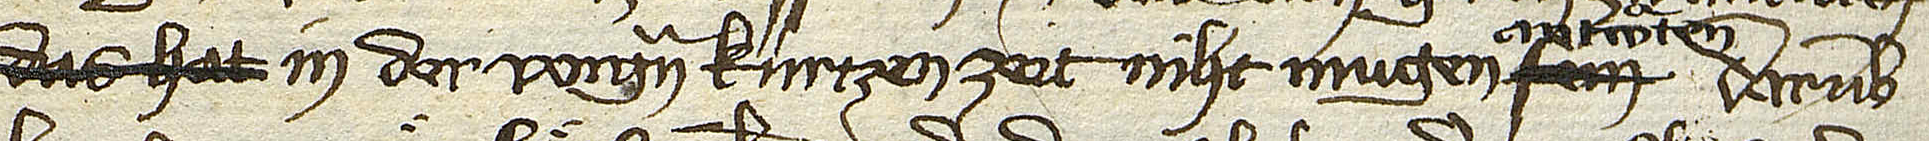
das hat in der vorgn* kurcʒen ʒeit niht mugen ſein . Darub*
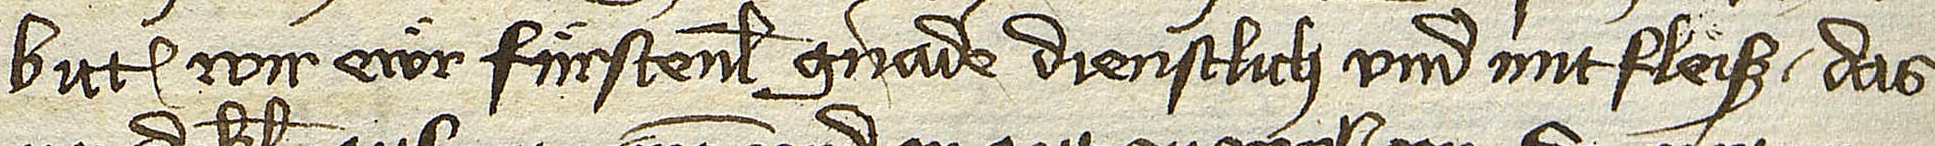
bitt* wir ewr fürſtenl* gnade dienſtlich vnd mit fleiſʒ / das
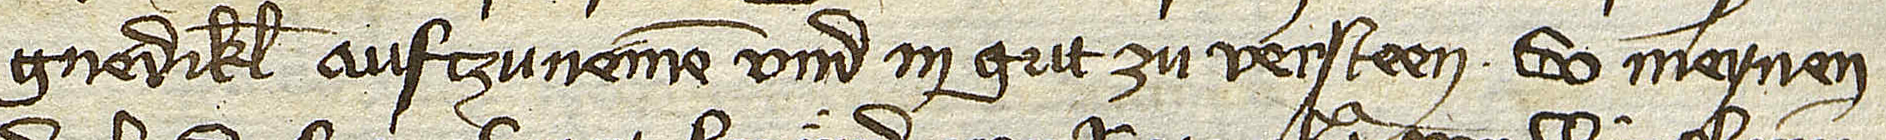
gnedikl* aufcʒuneme* vnd in gut ʒu verſteen . So meynen
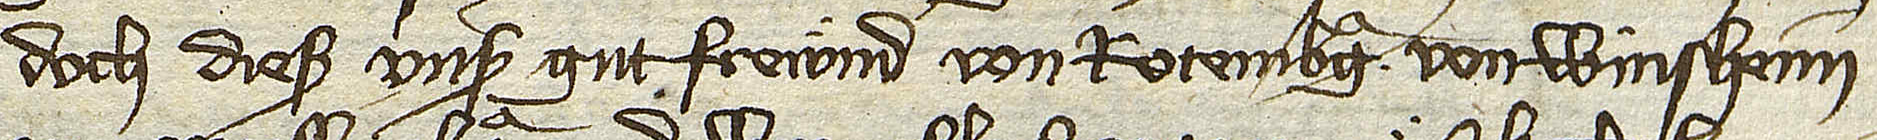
doch dieſ* vnſ* gut frewnd von Rotemb*g . von Winſheim*
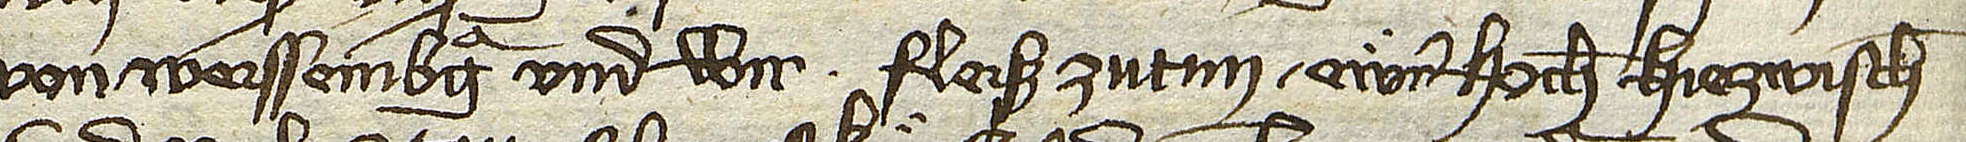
von weiſſemb*g vnd wir . fleiſʒ ʒutun / ewr* hoch* hieʒwiſch*
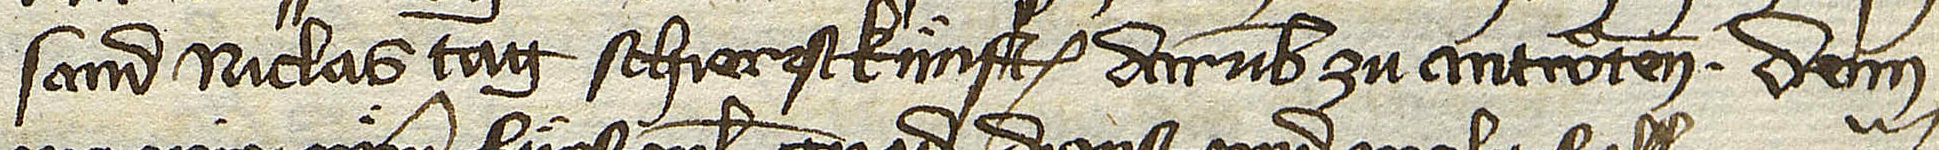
ſand Niclas tag ſchieriſtkünft* darub* ʒu antw*ten . Denn
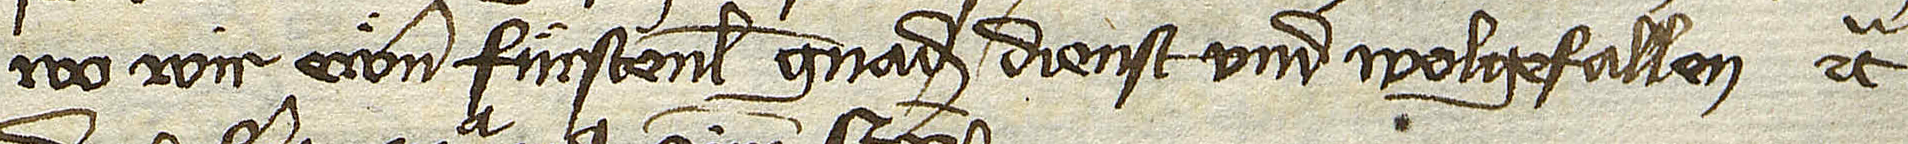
wo wir ewn* fürſtenl* gnad* dienſt vnd wolgefallen ec*
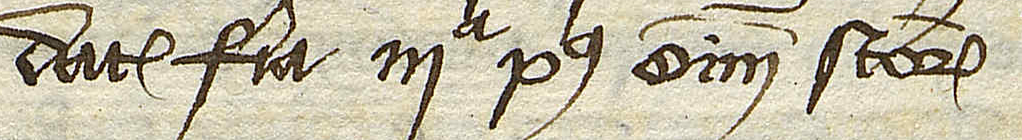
dat* f*ia iii* p* Omi* ſco*
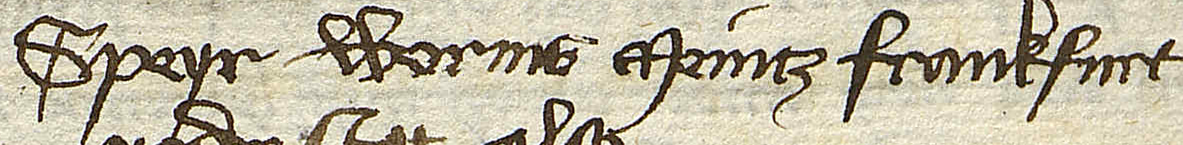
Speyr Worms Meincʒ frankfurt
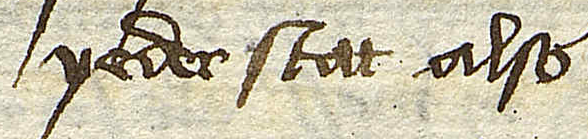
yeder ſtat alſo
